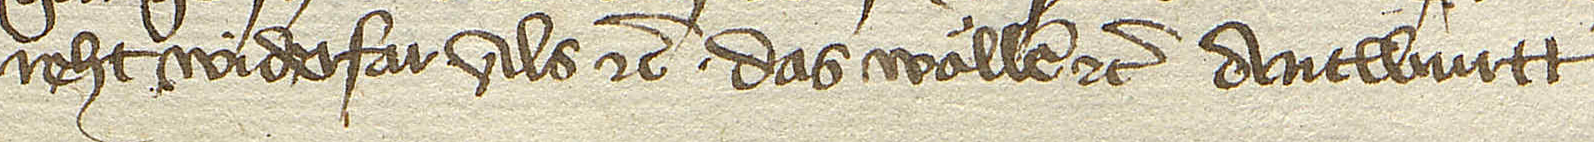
reht widerfar Als ec* / das wölle* ec* Antwurtt
